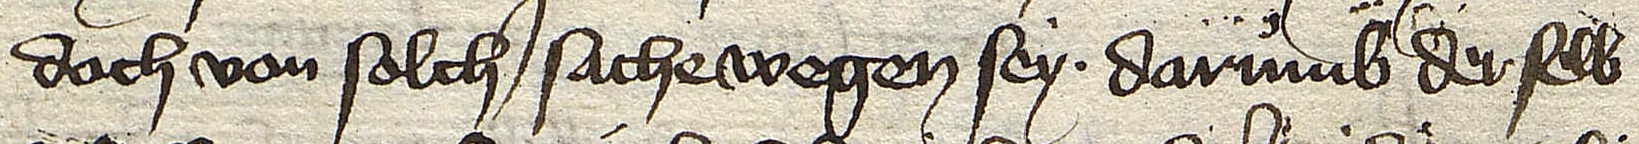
doch von ſolch* ſache wegen ſey . darümb der ſelb
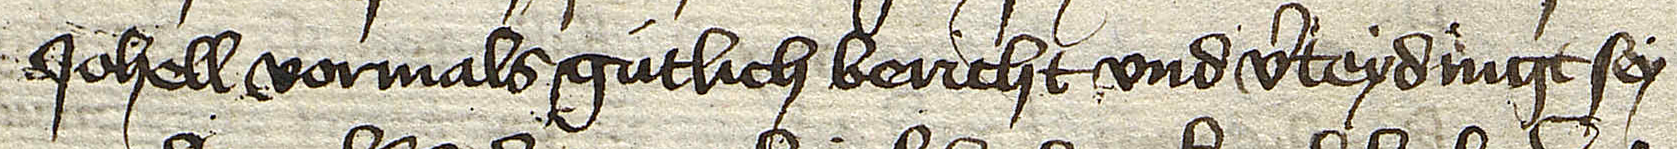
Iohell vormals gütlich bericht vnd v*teydingt ſey
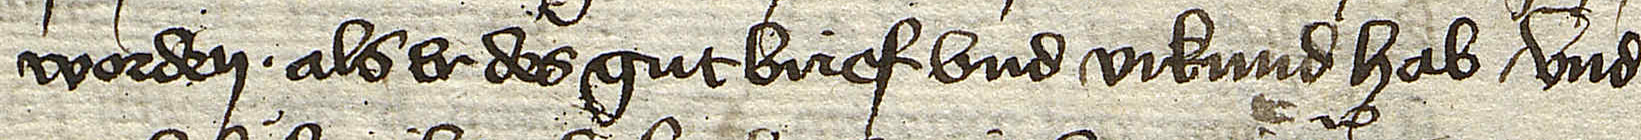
worden . als Er des gut brief vnd vrkund hab / Vnd
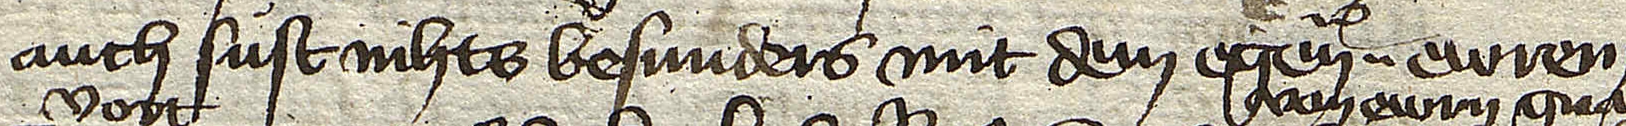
auch ſüſt nihts beſunders mit dem egen* ~ ewrem
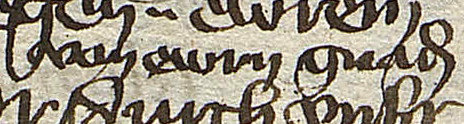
von ewrn gnad*
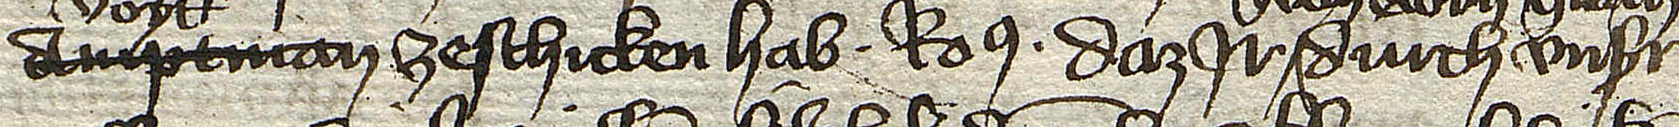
Amptman cʒeſchicken hab . Ro* . daʒ Ir durch vnſ*r
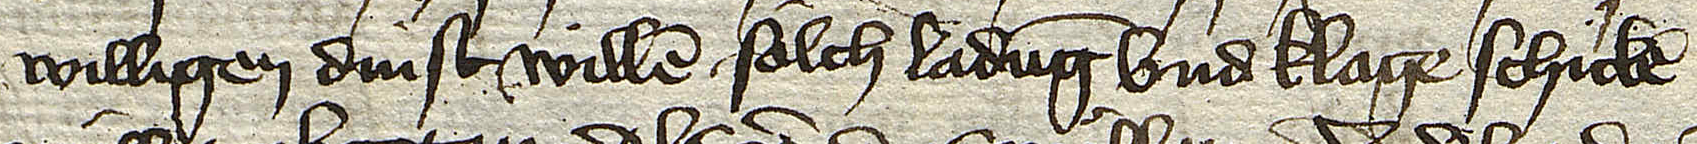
willigen dinſt wille* / ſölich ladu*g vnd klage ſchicke*
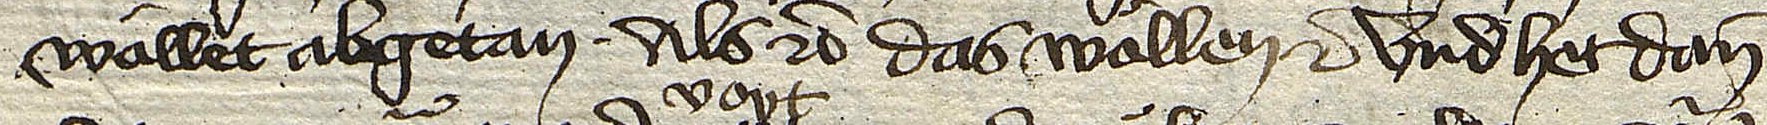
wöllet abgetan . Als ec* Das wöllen ec* Vnd het dan*
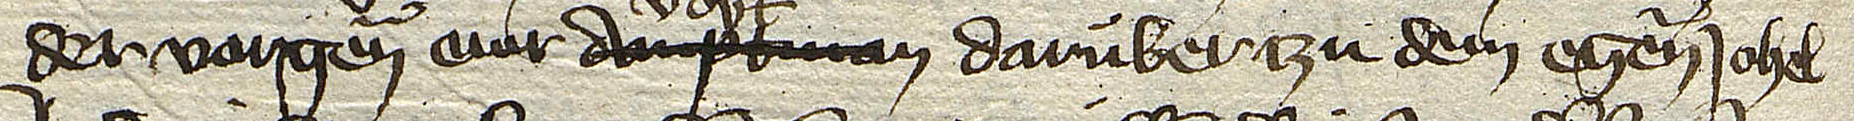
der vorgen* ewr Amptman darüber cʒu dem egen* Iohel
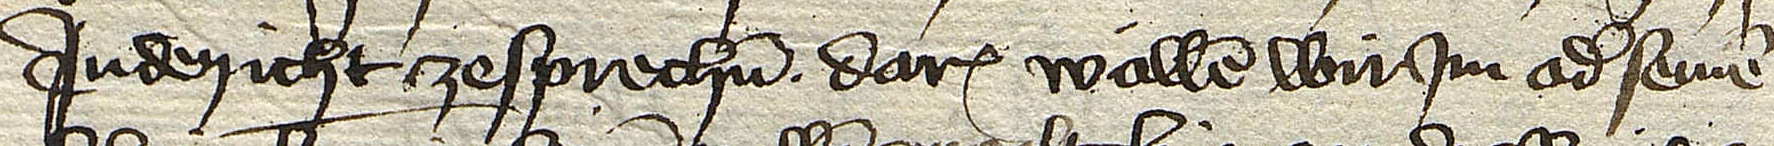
Iuden icht cʒeſprechn* . dar* wölle* wir Im od* ſeine*
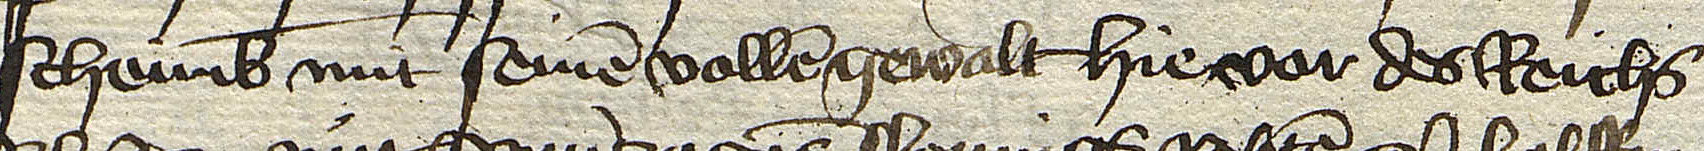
ſcheinb* mit ſeine* volle* gewalt hie vor des Reichs
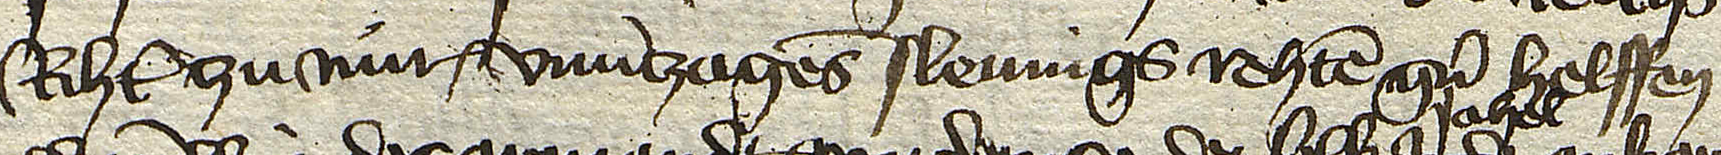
Riht* cʒu nür* vnu*cʒoge*s ſlewnigs rehte* g*n helffen
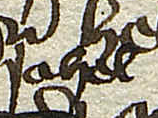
Iohel
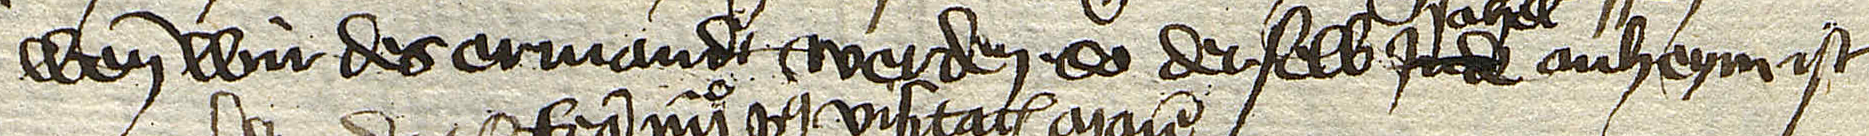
wen* wir des ermandt werden . So derſelb Iude anheym iſt
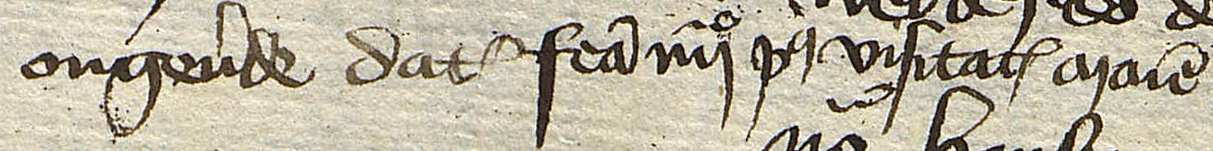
ongeu*de dat* fea* iiii* p* viſitat* Maie*
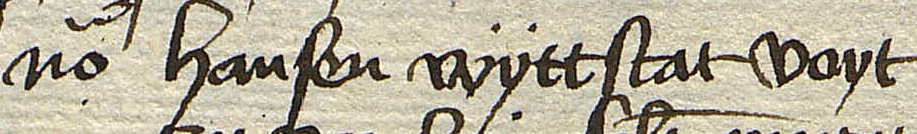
no* hanſen wyttſtat voyt
